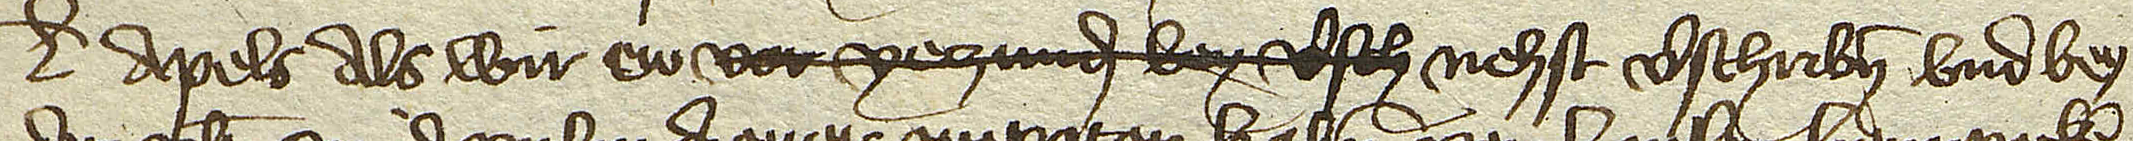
L* Apels Als wir ew vor yecʒund* bey v*ſch nehſt v*ſchribn* vnd bey
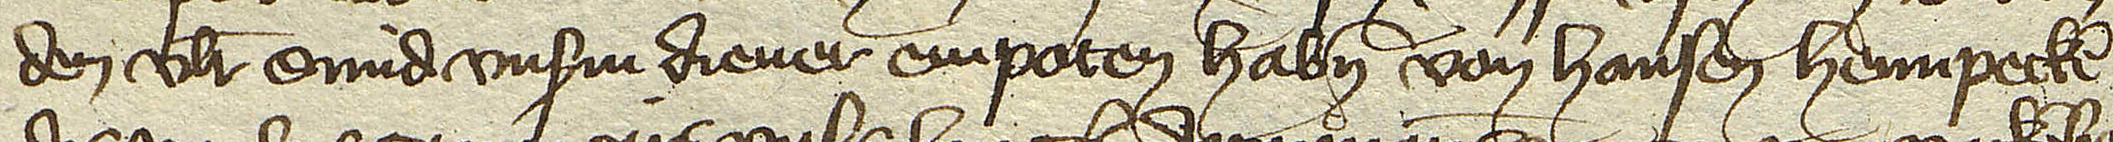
dem vlr* Smid vnſ*m diener empoten habn* von hanſen heimpecke*
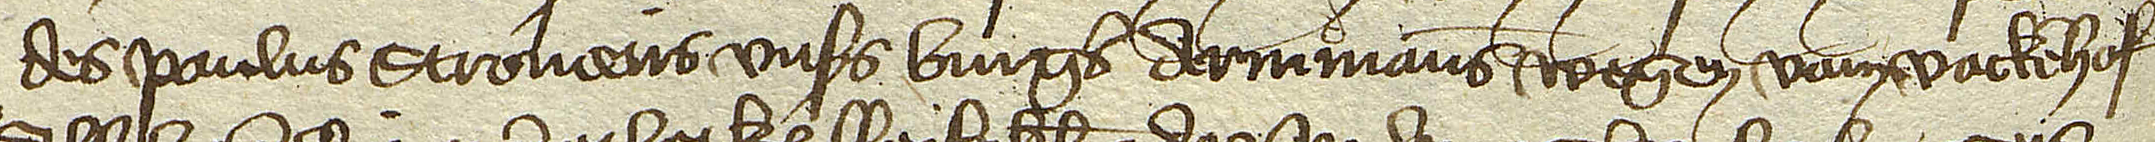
des paulus Stromeirs vnſ*s burgs* Armmans* wegen vom vacke*hof
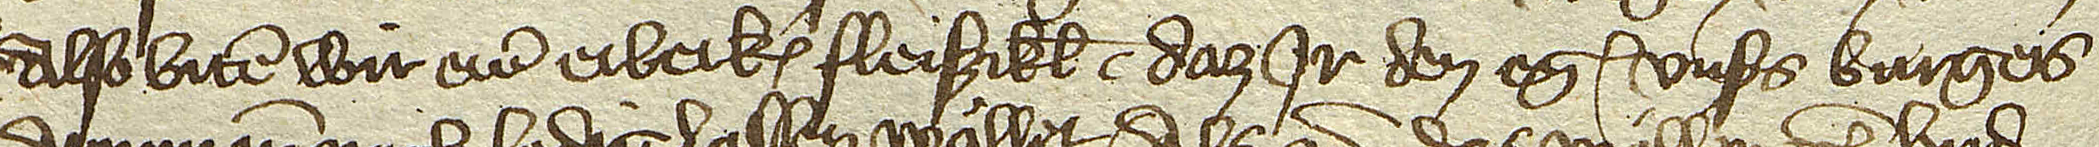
Alſo bite* wir ew* erberk* fleiſʒikl* / daʒ Ir den eg* vnſ*s burgers
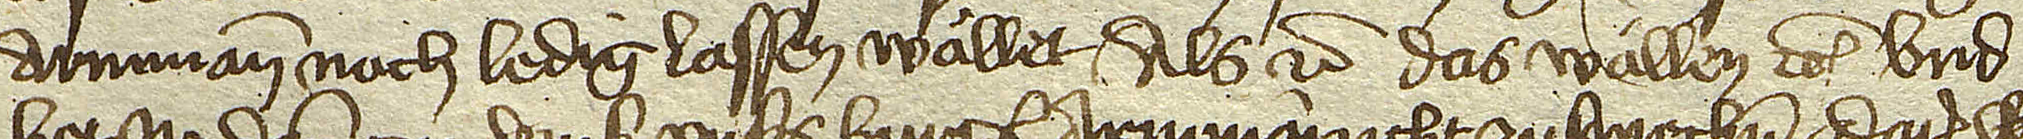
Armman* noch ledig laſſen wöllet / Als ec* das wöllen ec* vnd
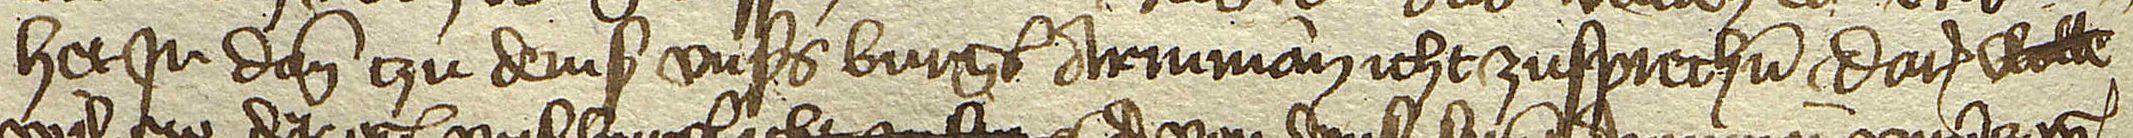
het Ir dan* cʒu demſ* vnſ*s burgs* Armman* icht cʒuſprechn* / dar* wolle*
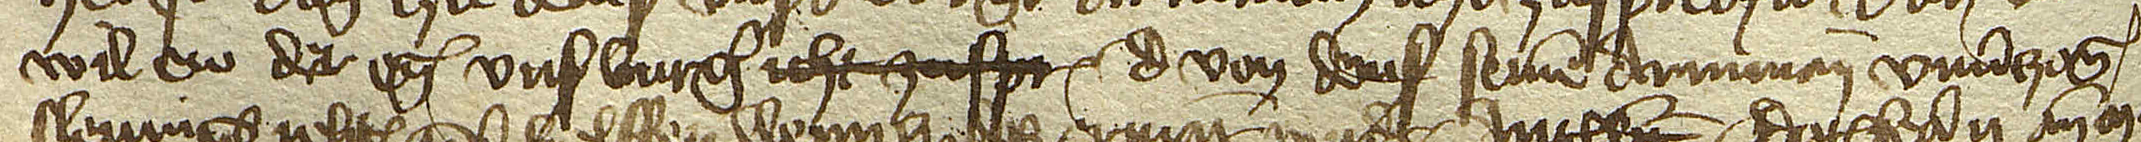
wil ew der eg* vnſ* burg* icht cʒuſpr d von demſ* ſeine* Armman vnu*cʒog*
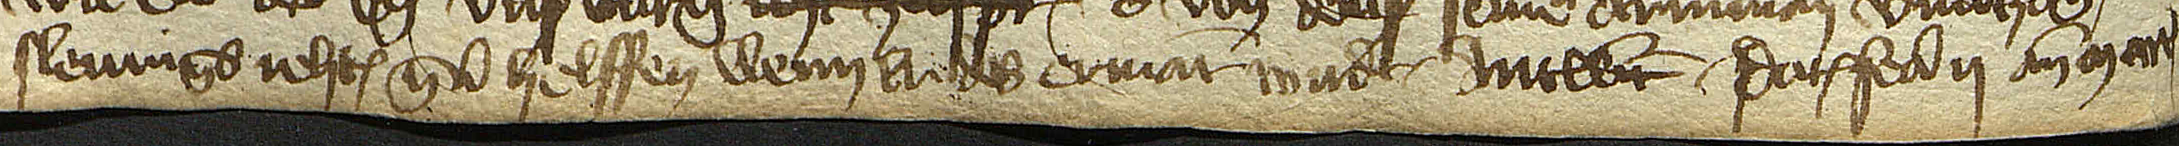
ſlewnigs reht* gn* helffenn wenn Er des ermat* wirdt / Antwt* / dat* fea* ii* an* Mar%%
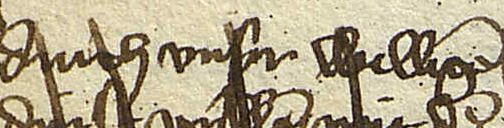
durch vnſ*r willige*
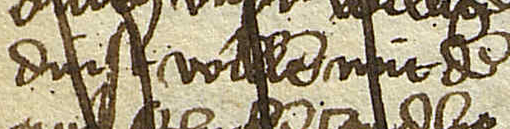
dinſt wille* mit d*
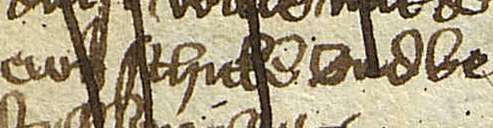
ewn* ſchicke* vnd be
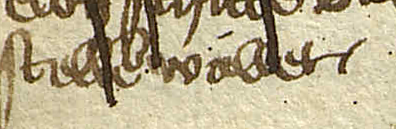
ſtelle* wöllet /
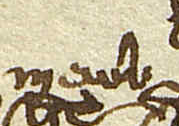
in ew*r
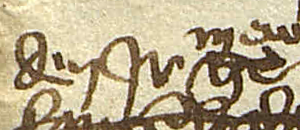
den Ir ge
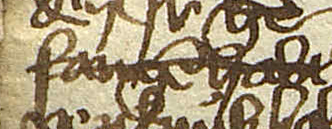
fange* habt
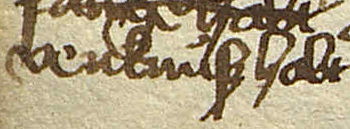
vencknüſʒ habt
